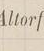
Altorf
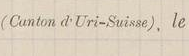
(Canton d'Uri–Suisse), le
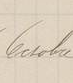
Octobre
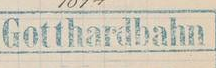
Monsieur Escher,
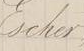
Direction
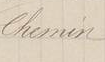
Chemin
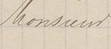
Monsieur le
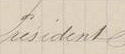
Président,
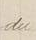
lettre
